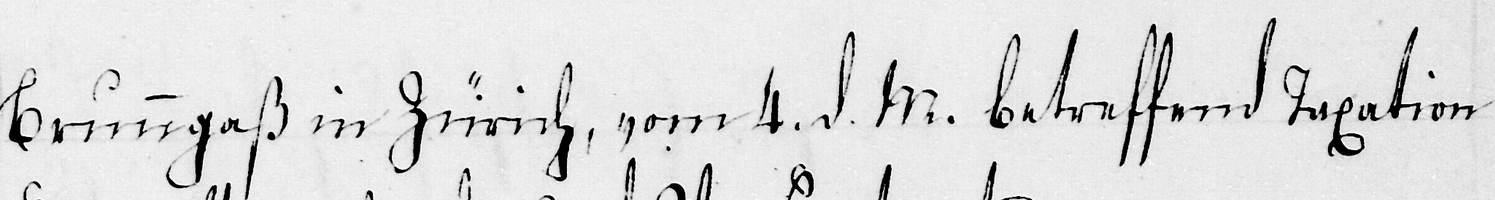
Brunngaß in Zürich, vom 4. d. M. betreffend Taxation
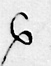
des
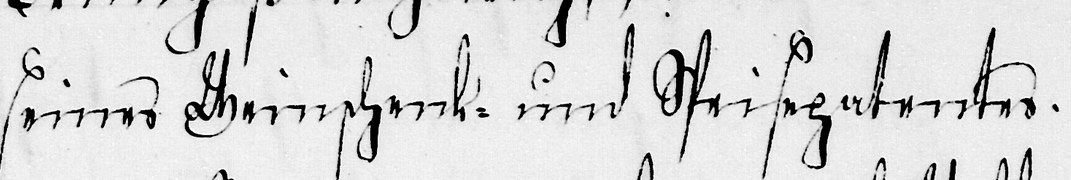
seines Weinschenk- und Speisepatentes.
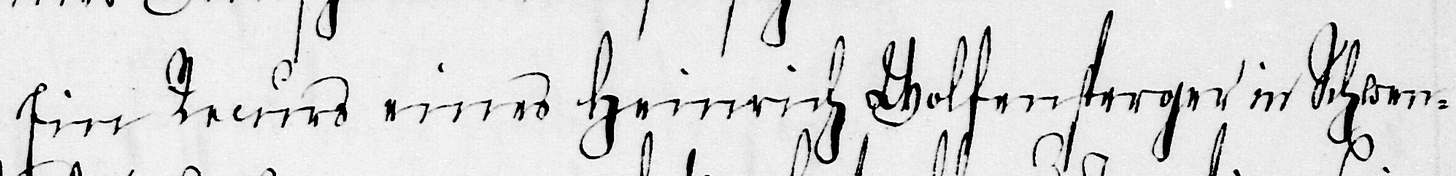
Ein Recurs eines Heinrich Wolfensperger in Schwen¬
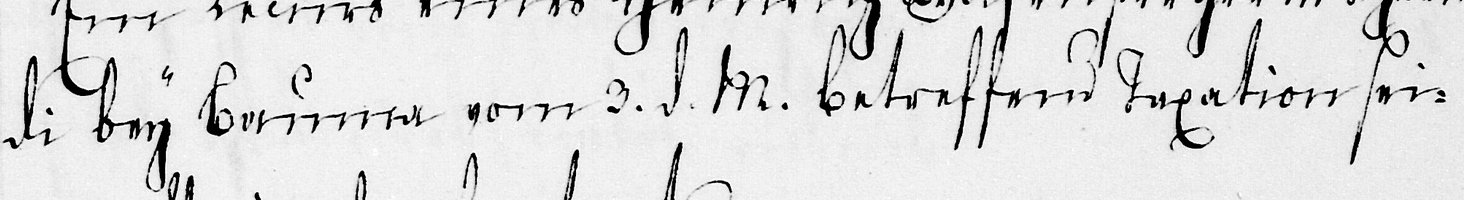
di bey Bauma vom 3. d. M. betreffend Taxation sei¬
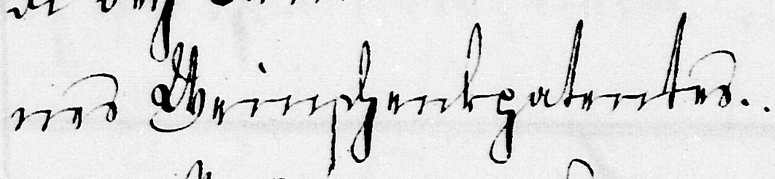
nes Weinschenkpatentes.
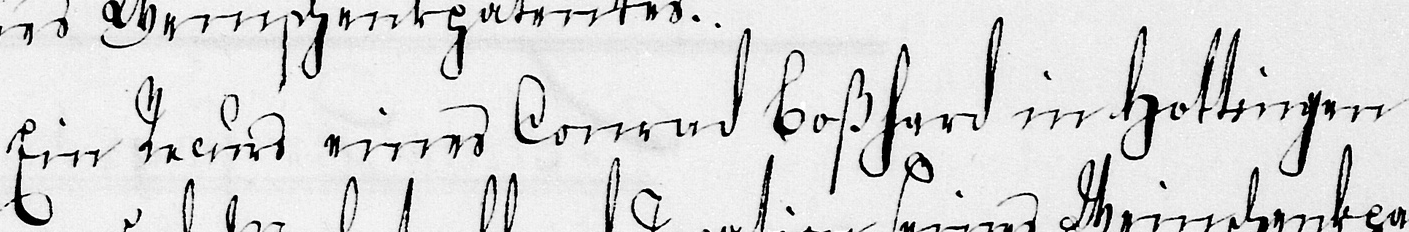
Ein Recurs eines Conrad Boßhard in Hottingen
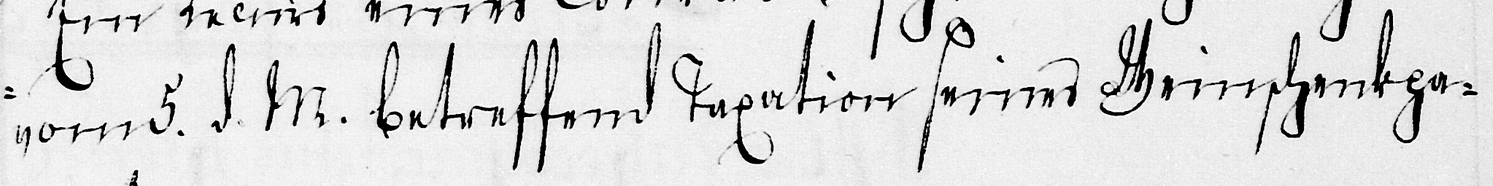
vom 5. d. M. betreffend Taxation seines Weinschenkpa¬
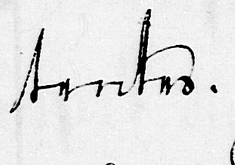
tentes.
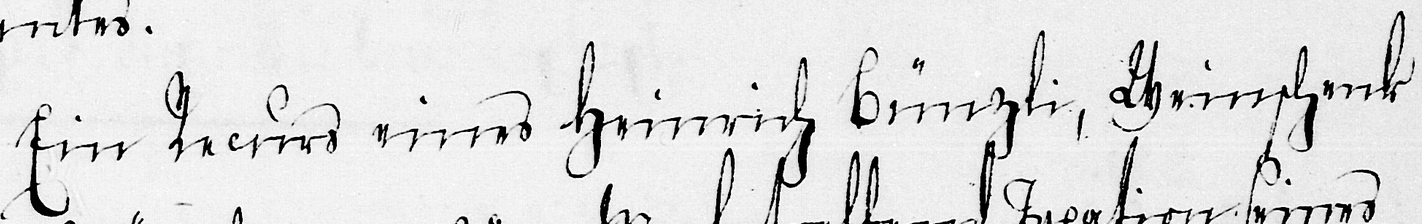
Ein Recurs eines Heinrich Bünzli, Weinschenk
